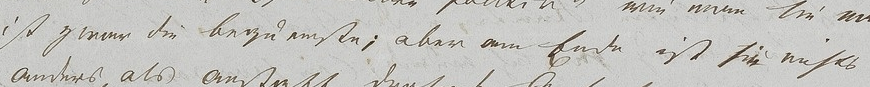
ist zwar die bequemste; aber am Ende ist sie nichts
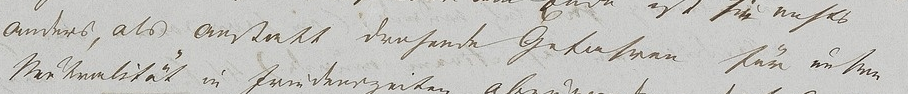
anders, als anstatt drohende Gefahren für unsre
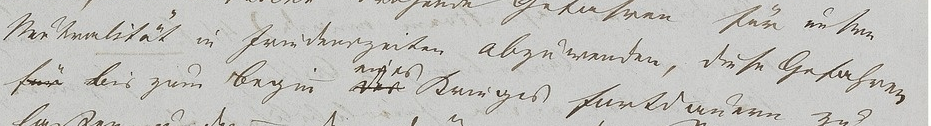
Neutralität in Friedenszeiten abzuwenden, diese Gefahren
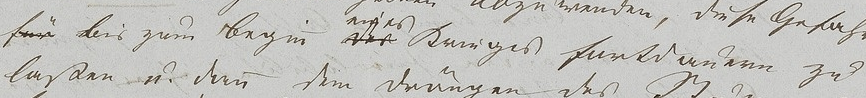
für bis zum Beginn deseines Krieges fortdauern zu
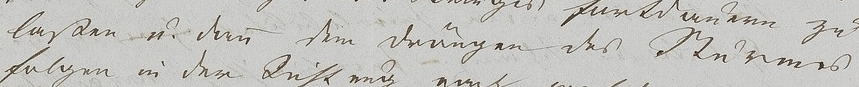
laßen u. dann dem Drängen des Sturmes
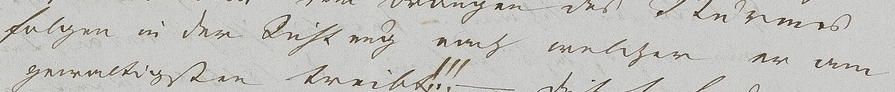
folgen in der Richtung nach welcher er am
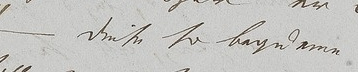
– Diese so bequeme
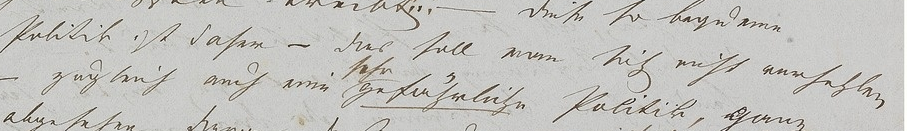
Politik ist daher – das soll man sich nicht verhehlen
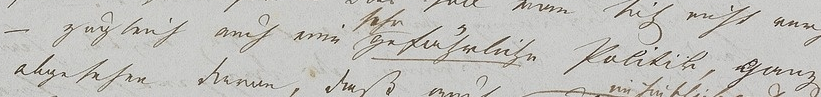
– zugleich auch eine sehrgefährliche Politik, ganz
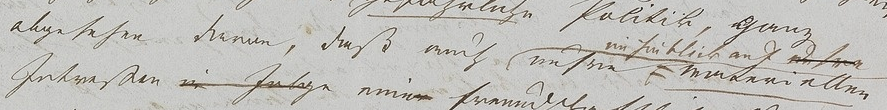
abgesehen davon, daß auch im Hinblick auf unsre unsre materiellen
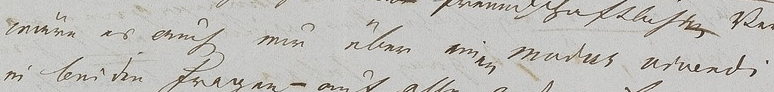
wäre es auch nur über einen modus vivendi
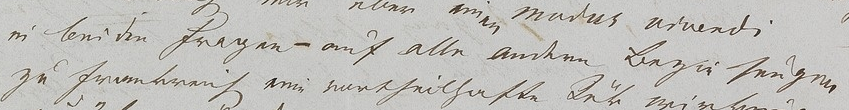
in beiden Fragen – auf alle andern Beziehungen
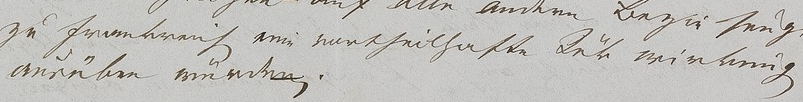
zu Frankreich eine vortheilhafte Rükwirkung
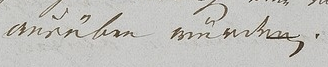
ausüben würden.
